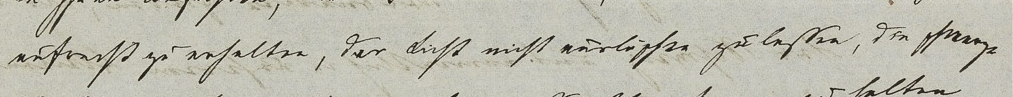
aufrecht zu erhalten, das Licht nicht auslöschen zu lassen, die schwarze
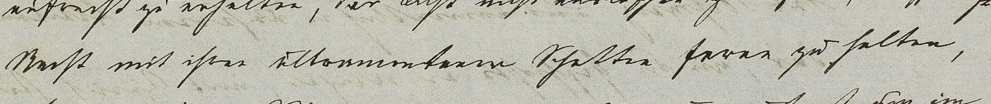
Nacht mit ihren ultramontanen Schatten ferne zu halten,
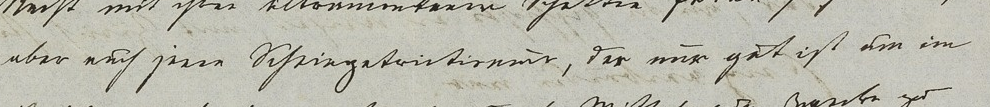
aber auch jenen Scheinpatriotismus, der nur gut ist um im
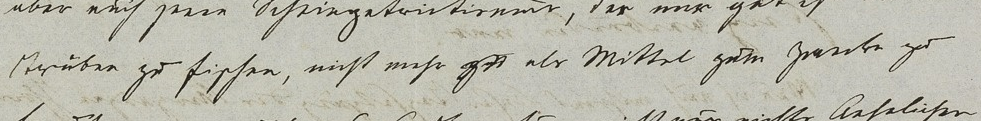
Trüben zu fischen, nicht mehr zu als Mittel zum Zwecke zu
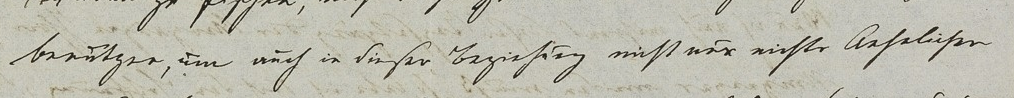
benutzen, um auch in dieser Beziehung nicht nur nichts Aehnliches
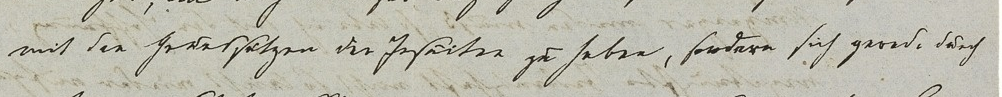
mit den Grundsätzen der Jesuiten zu haben, sondern sich gerade durch
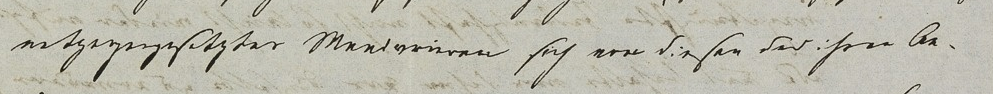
entgegengesetztes Manövrieren sich vor diesen und ihren An-
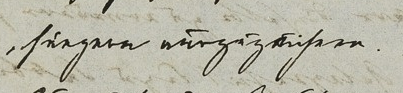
hängern auszuzeichnen.
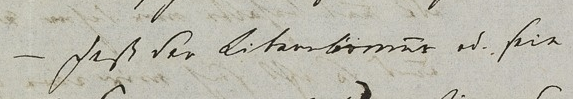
– Daß der Liberalismus od. sein
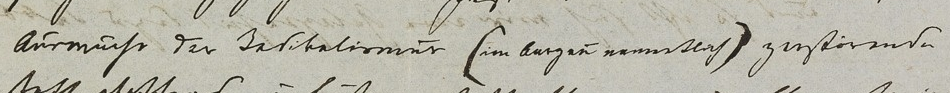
Auswuchs der Radikalismus (im Aargau namentlich) zerstörende
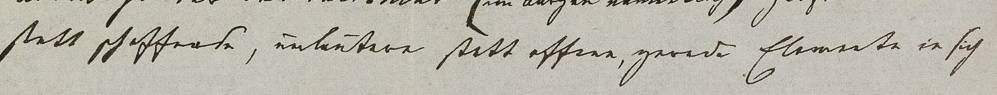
statt schaffende, unlautere statt offene, gerade Elemente in sich
